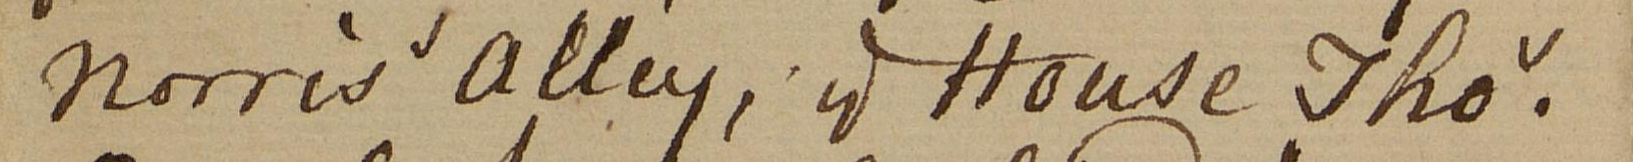Norris^s Alley, y^e House Tho^s.
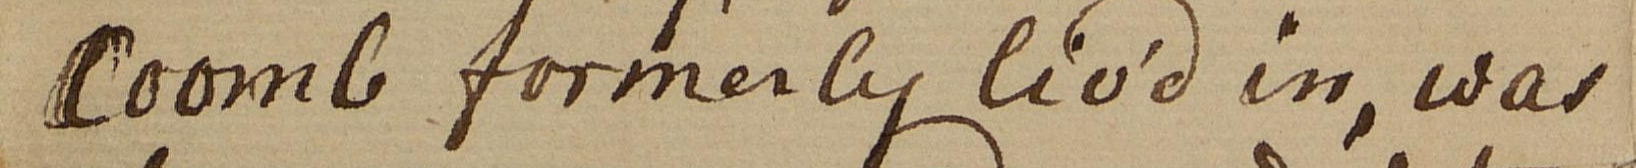Coomb formerly liv'd in, was
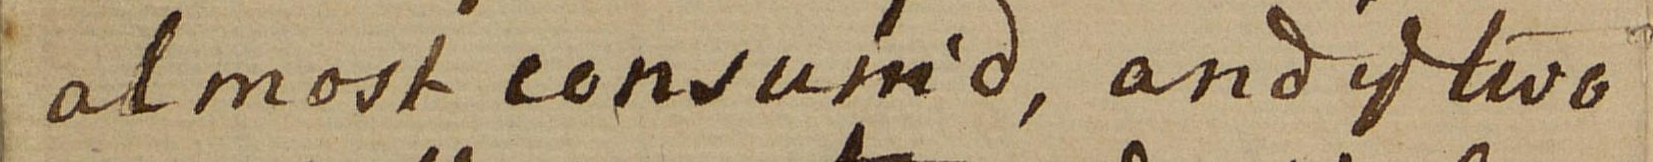almost consum'd, and y^e two
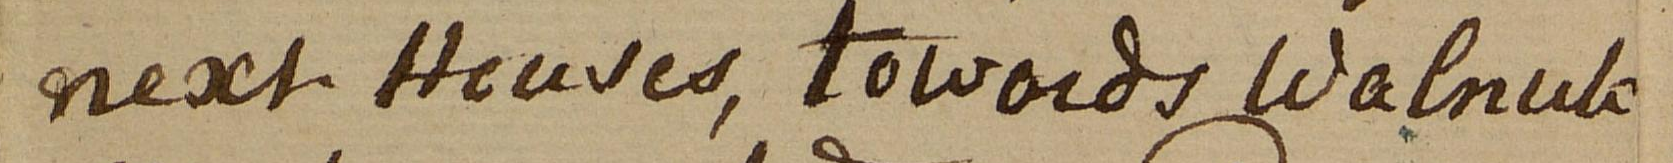next Houses, towards Walnut
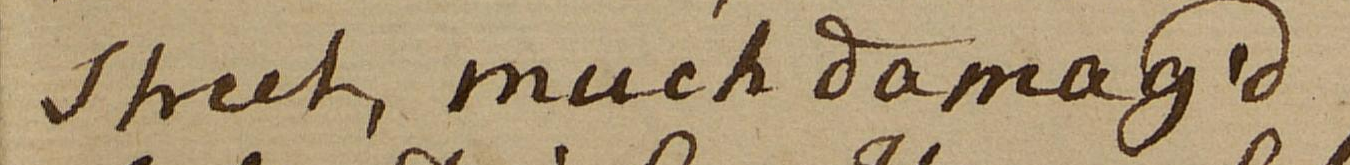Sheet, much damag'd
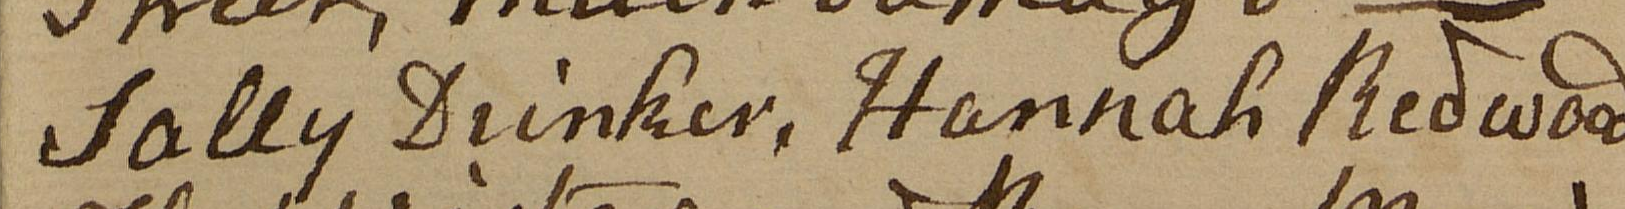Sally Drinker, Hannah Redwood
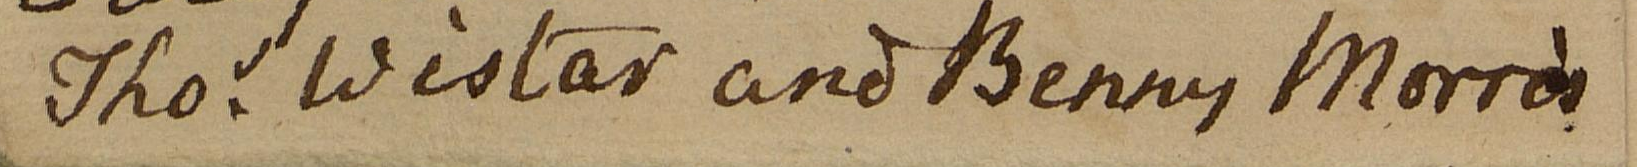Tho^s. Wistar and Benny Morris
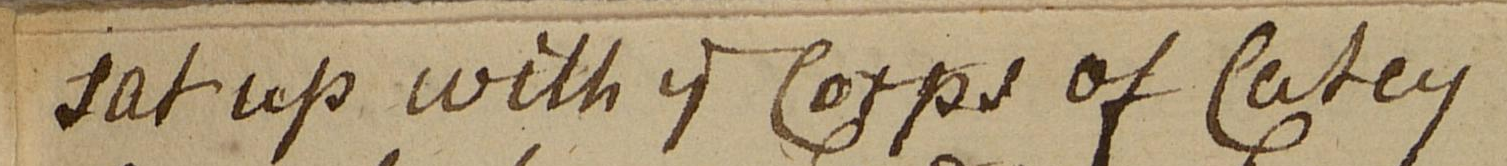sat up with y^e Corps of Catey
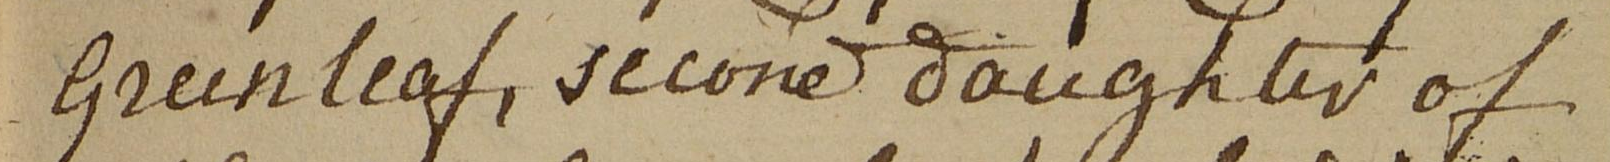Greenleaf, second daughter of
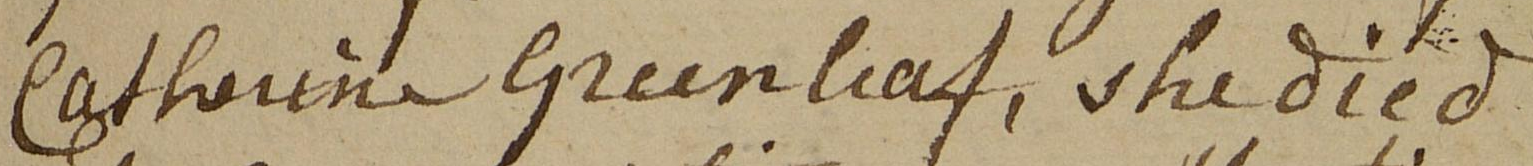Catherine Greenleaf, she died
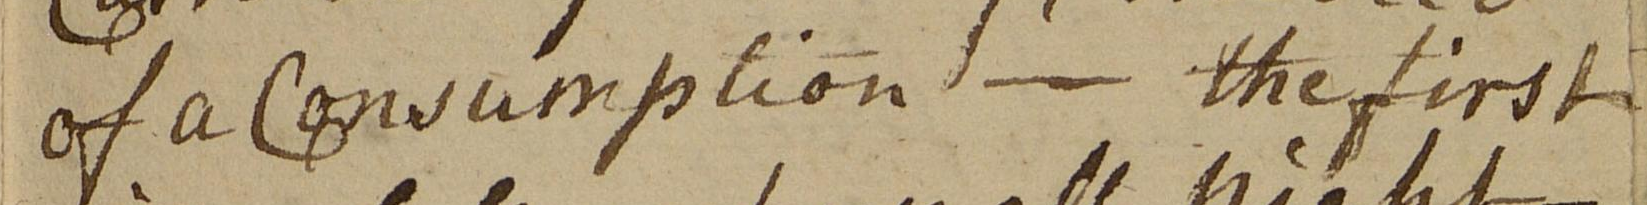of a Consumption- the first
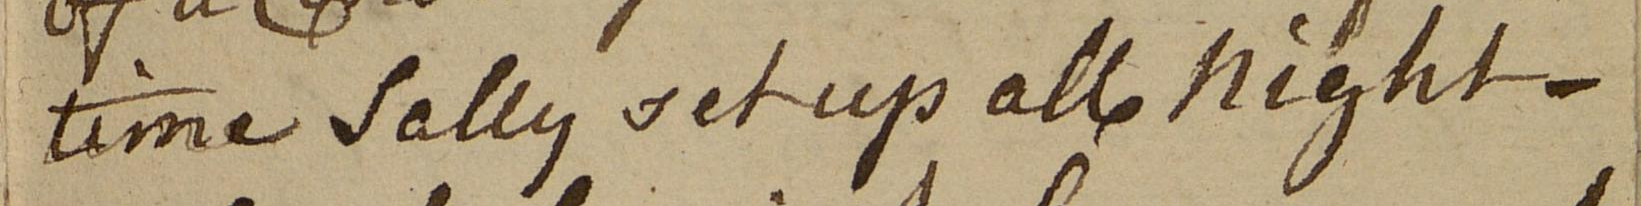time Sally set up all Night-
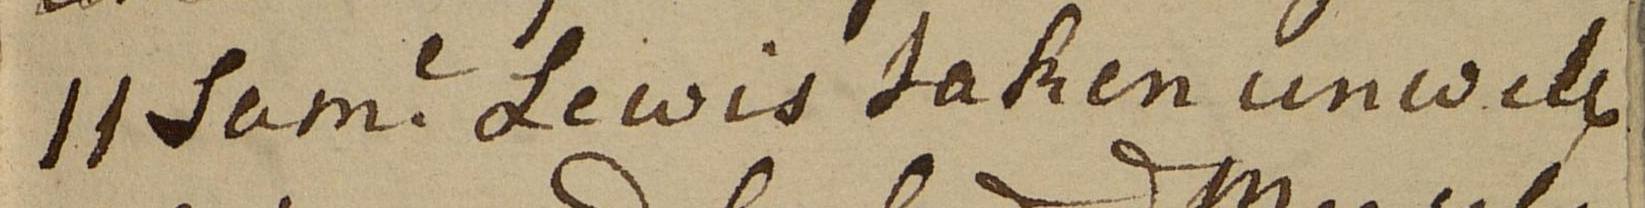11 Sam^l. Lewis taken unwell
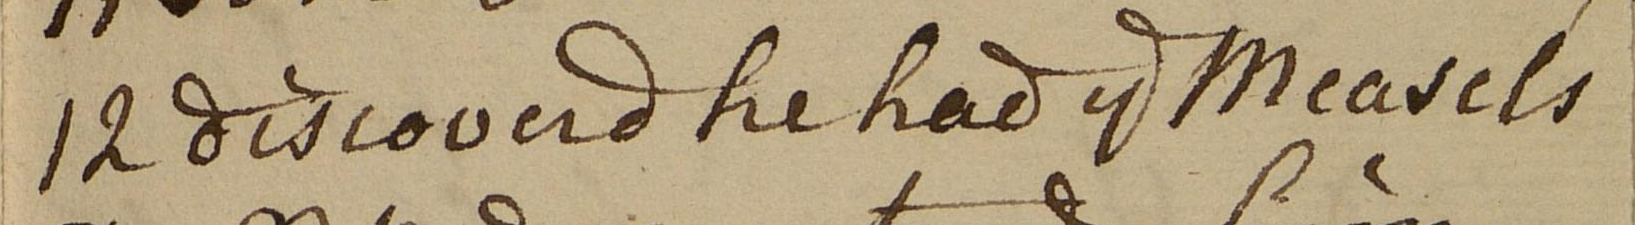12 discoverd he had y^e Measels
